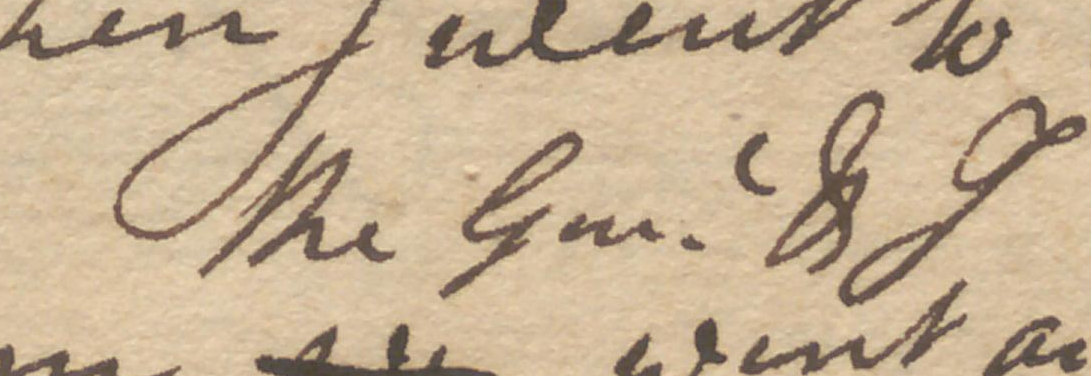Mhe Gen^l. & I
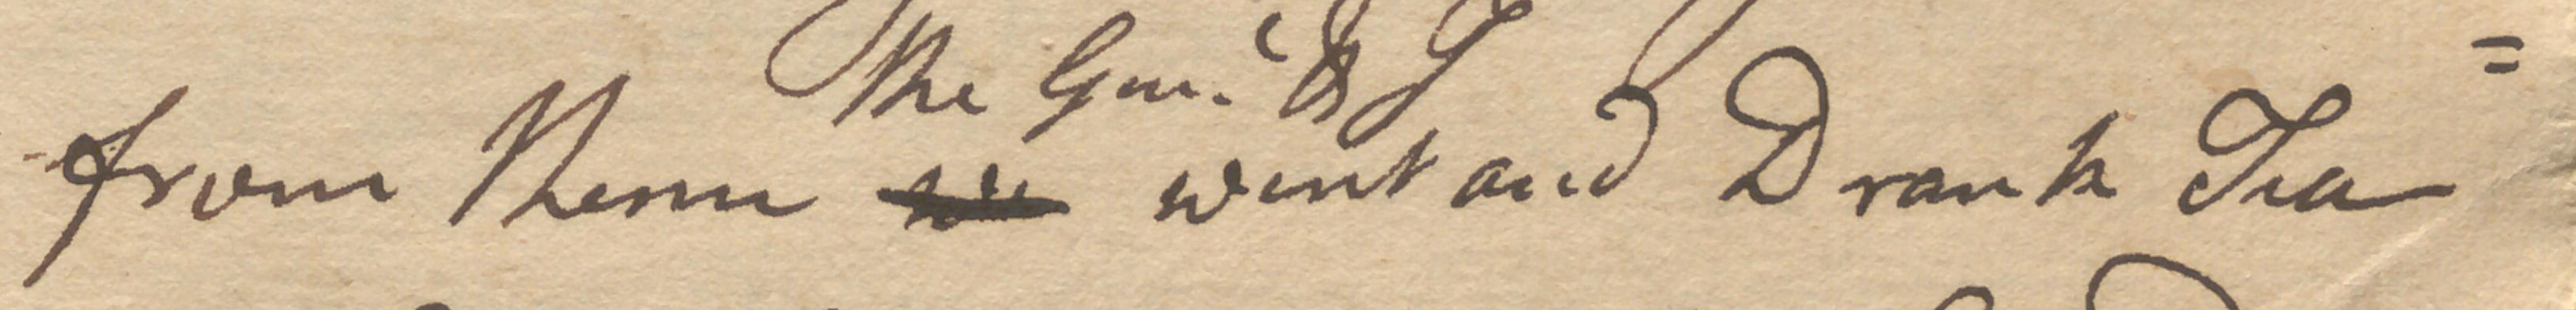from Thence [we] went and Drank Tea
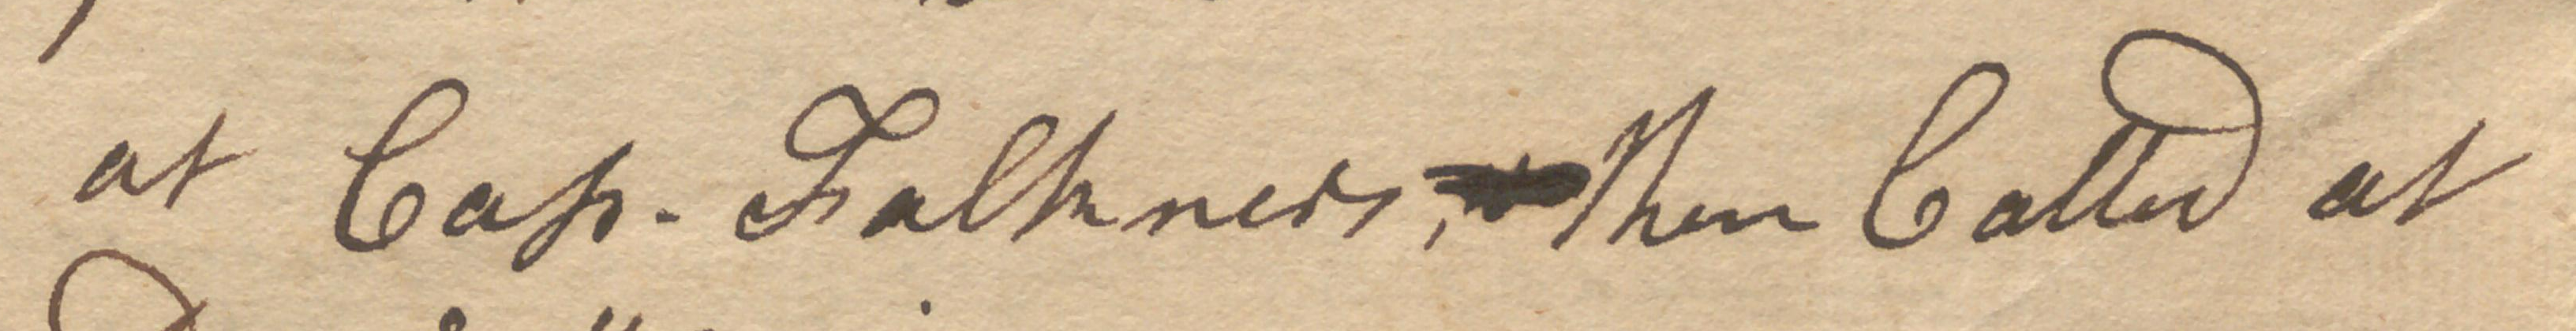at Cap. Falkners, then Called at
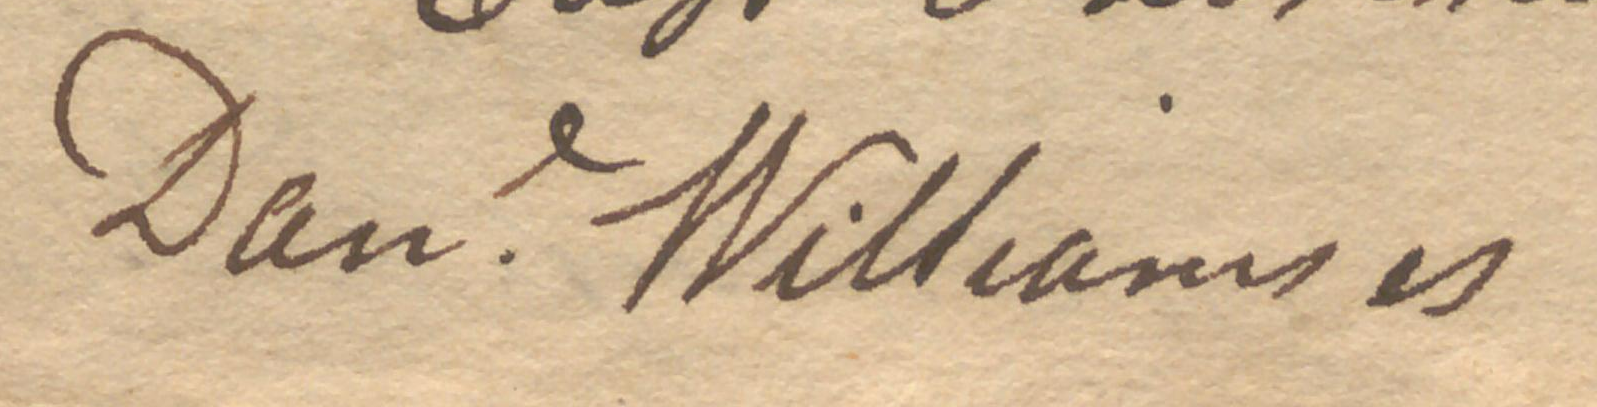Dan^l. Williamses
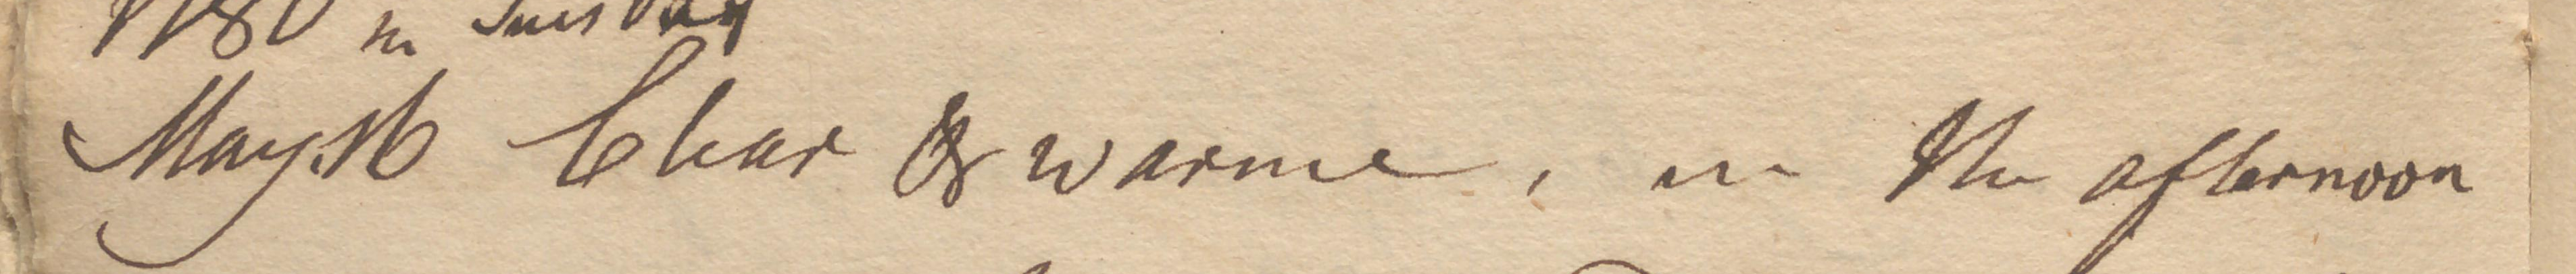May 16 Clear & warme, in the afternoon
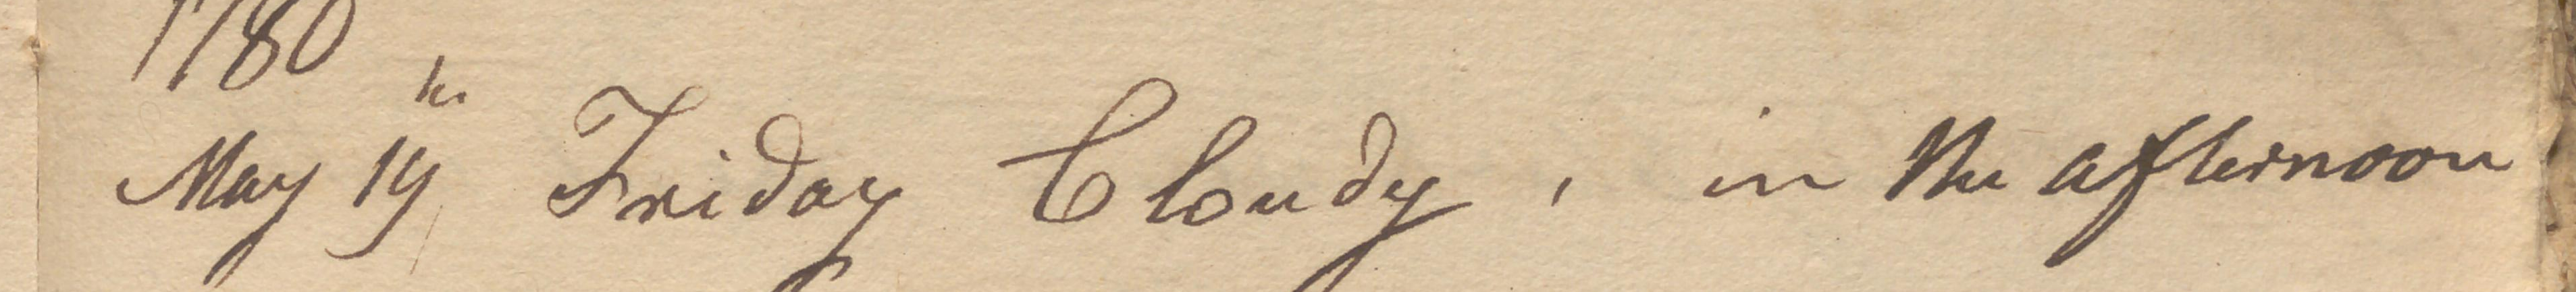May 19 Friday Cloudy, in the afternoon
